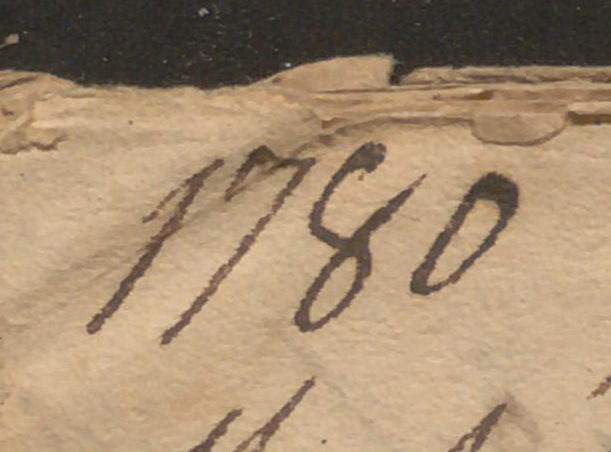1780
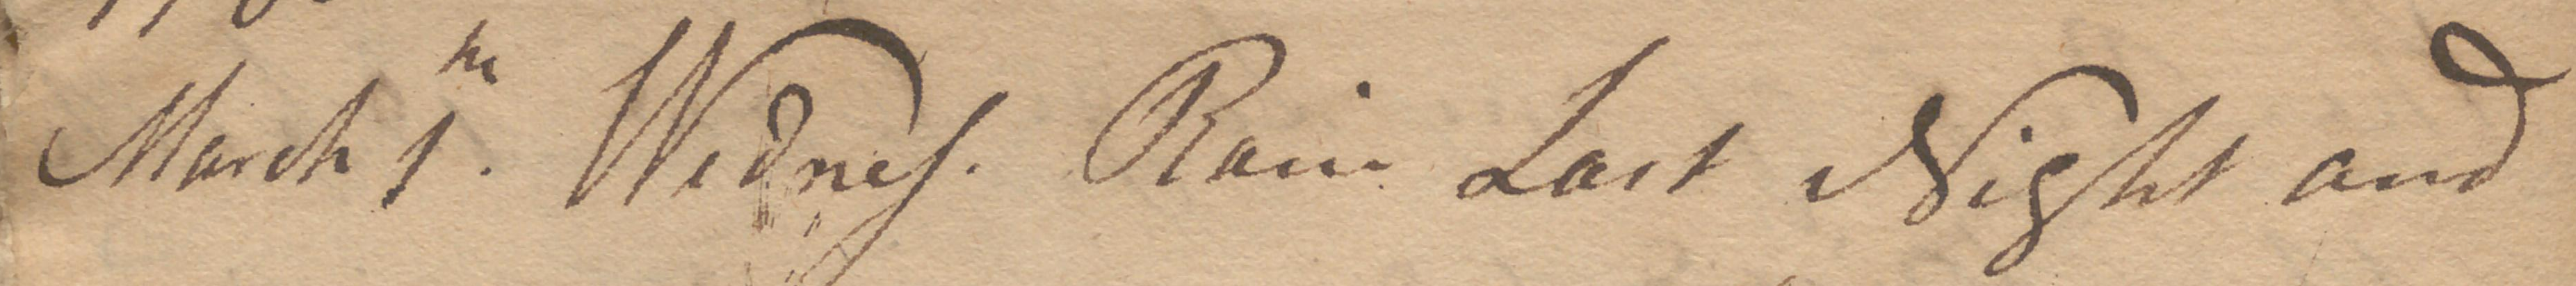March 1^th. Wednes. Rain Last Night and
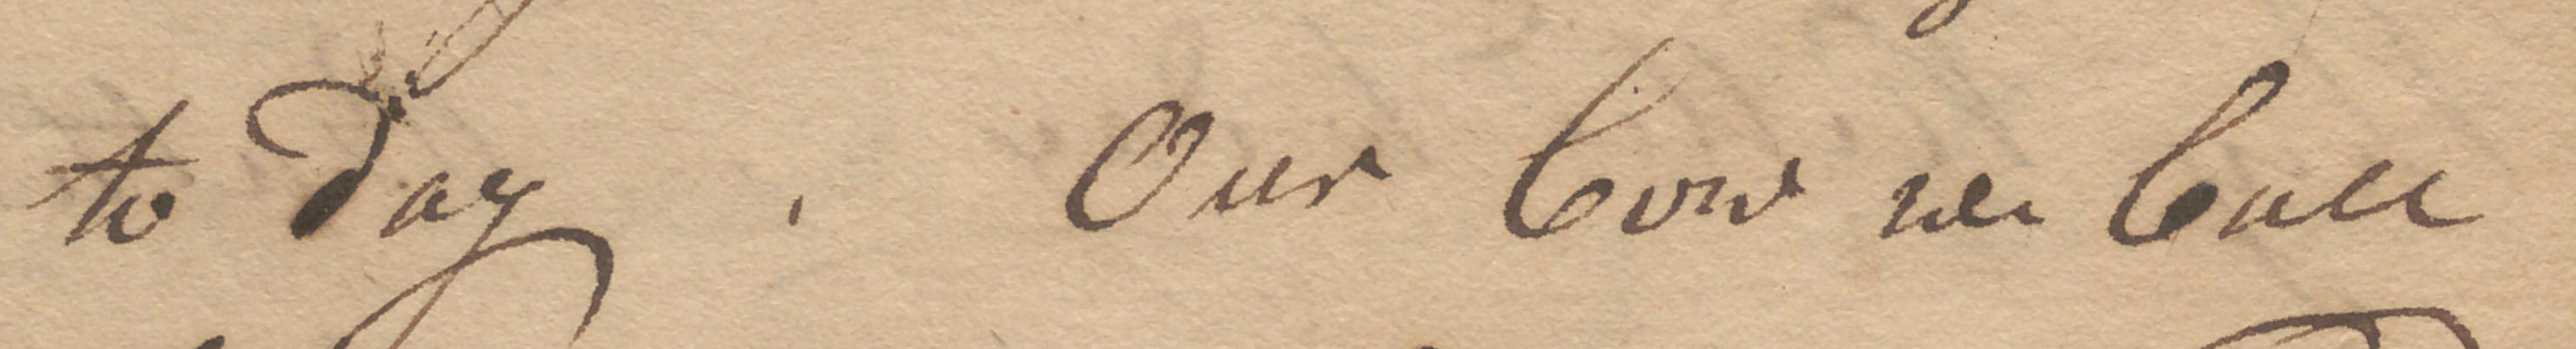to day. Our Cow we Call
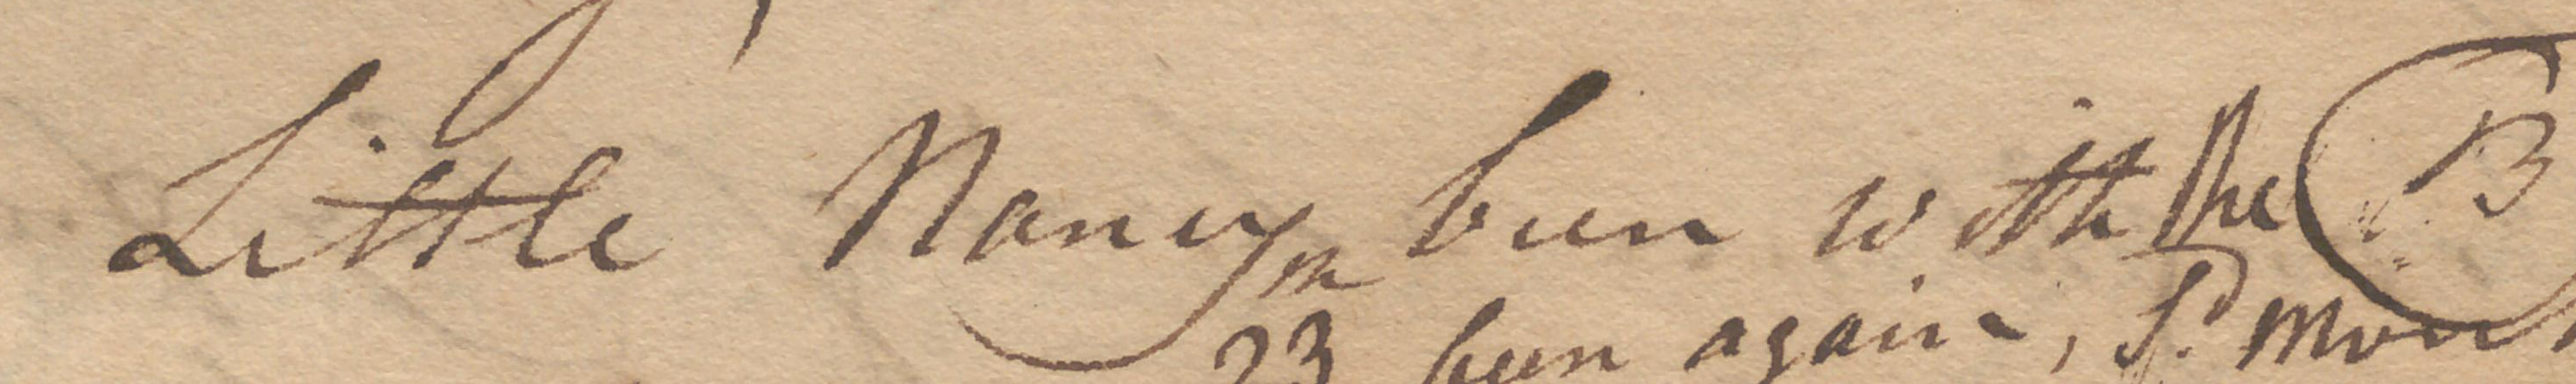Little Nancy been with the
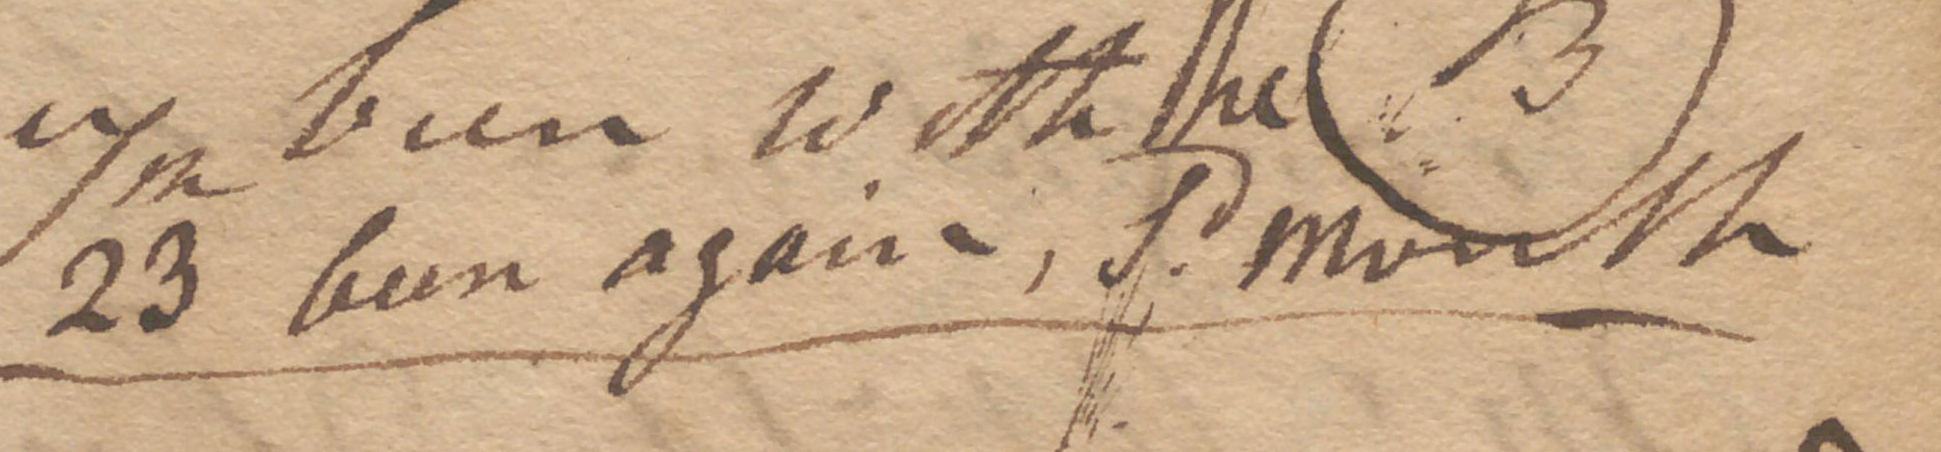23 been again, S^d. Month
